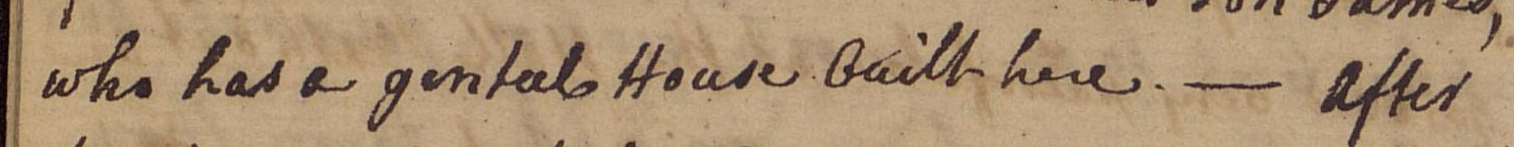who has a gental House built here.- After
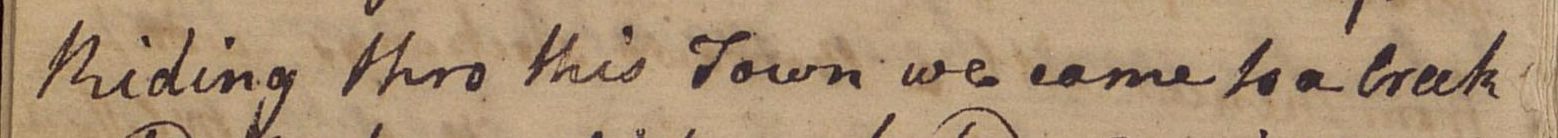Riding thro this Town we came to a Creek
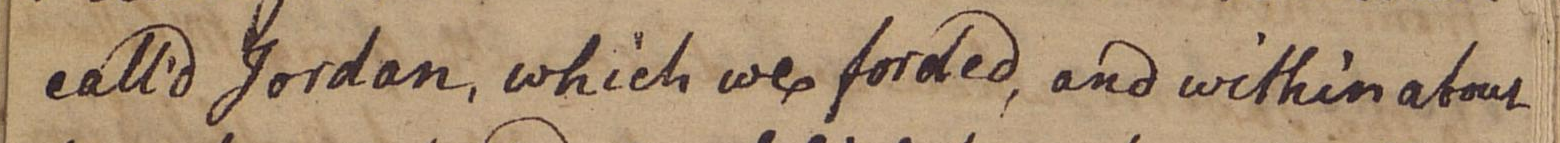call'd Jordan, which we forded, and within about
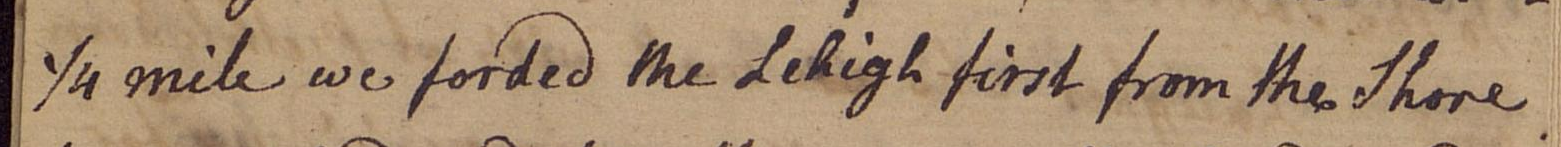1/4 mile we forded the Lehigh first from the Shore
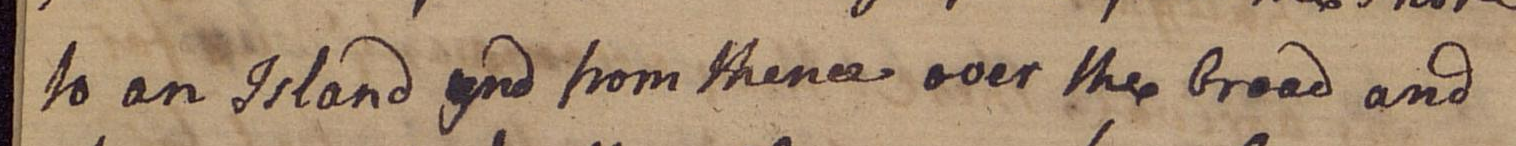to an Island and from thence over thee broad and
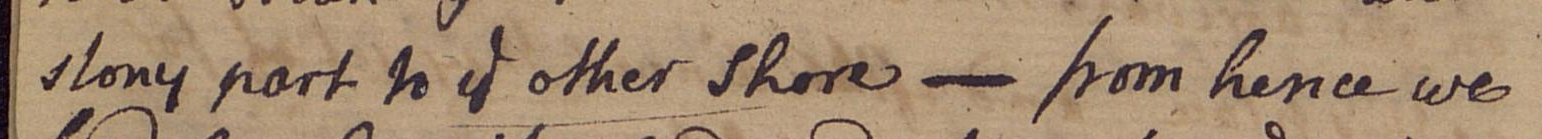stony part to y^e other Shore- from hence we
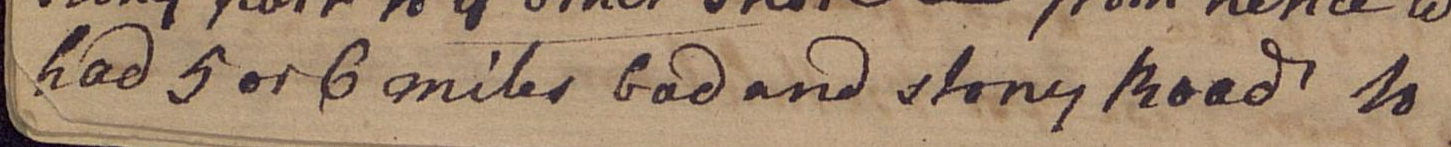had 5 or 6 miles bad and stony Road to
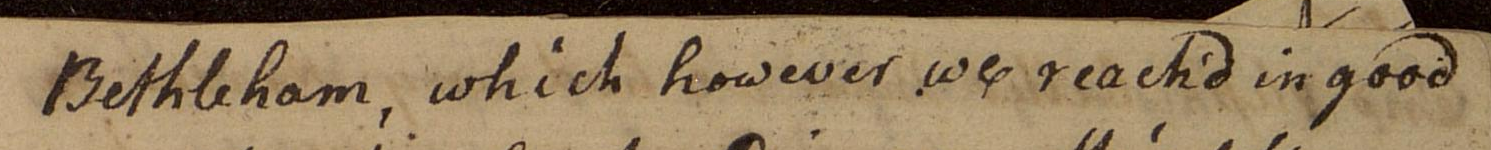Bethleham which however we reach'd in good
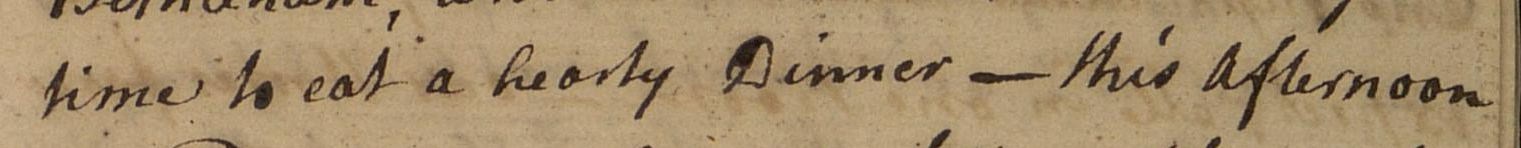time to eat a hearty Dinner- This afternoon
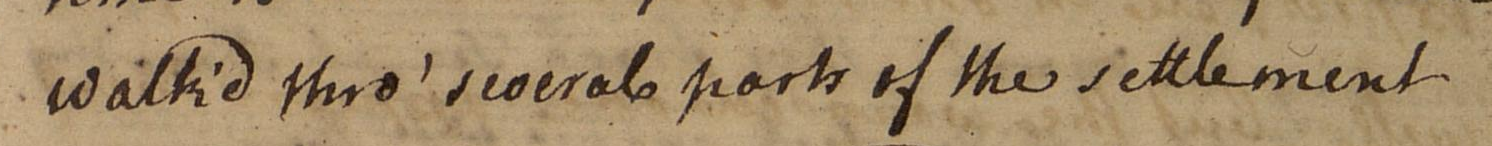walk'd thro several parts of the settlement
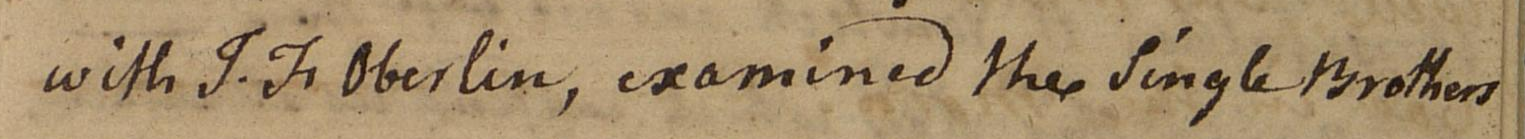with T. F Oberlin, examined the Single Brothers
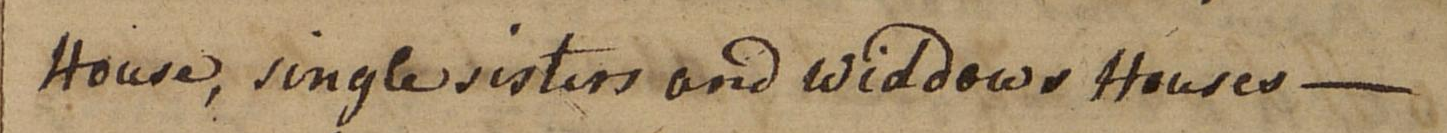House, single sisters and widdows Houses-
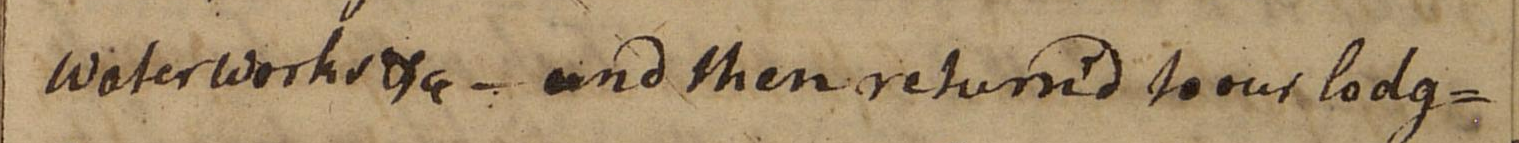Water works &c- and then return'd to our lodg-
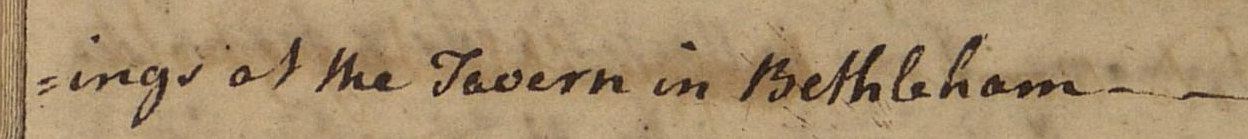-ings at the Tavern in Bethleham-
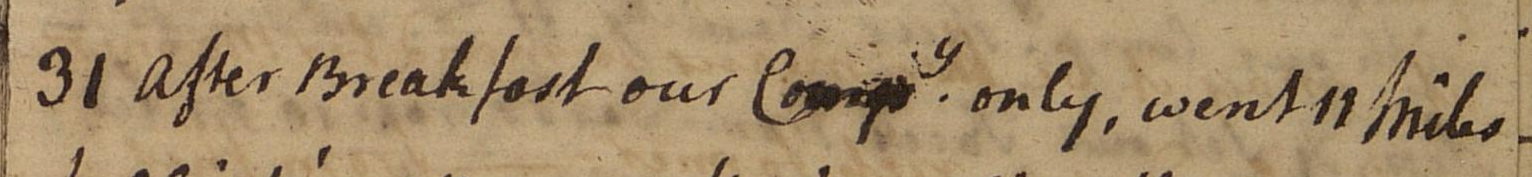31 After Breakfast our Comp^y. only, went 11 miles
